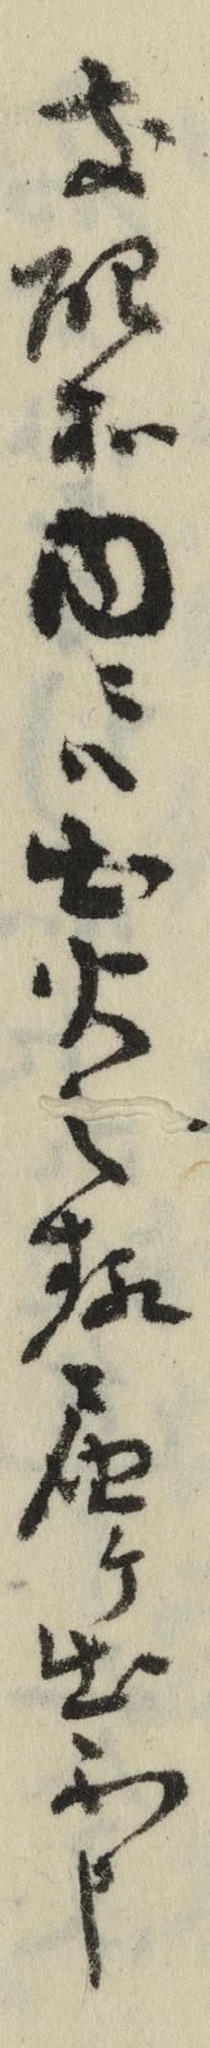支配所内ニハ出火之趣届ケ出不申
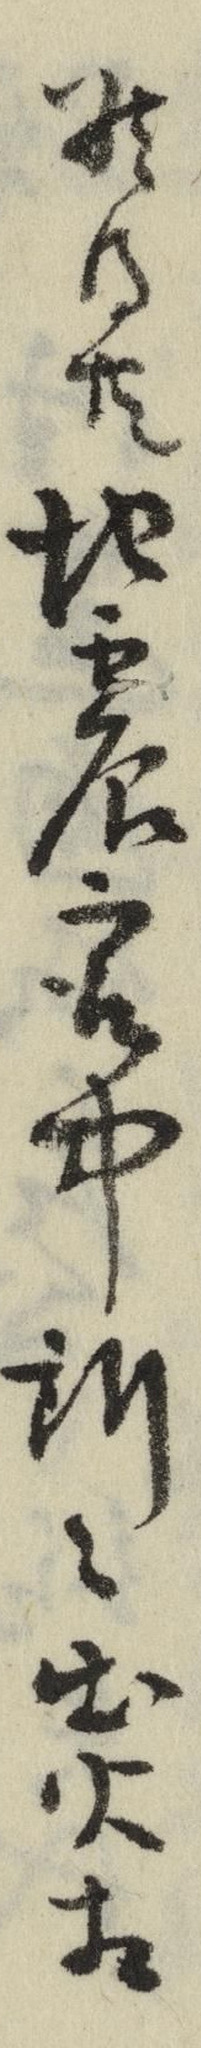候得共地震最中所々出火相
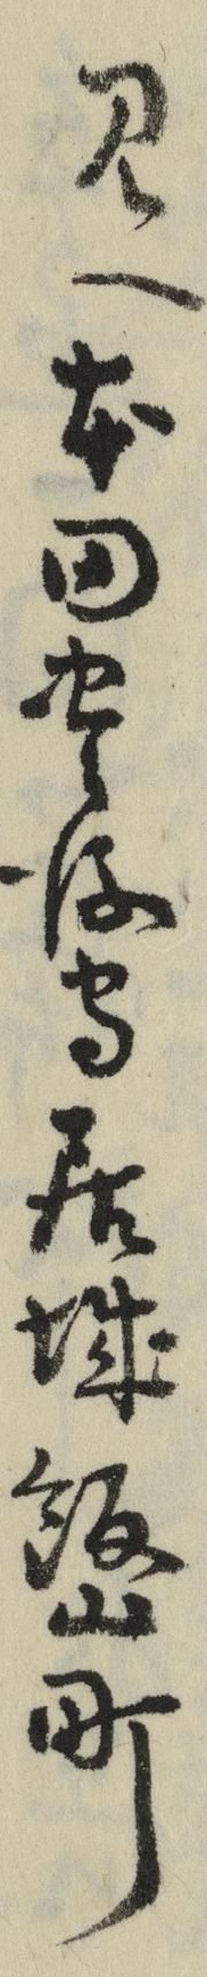見へ本田豊後守居城飯山町
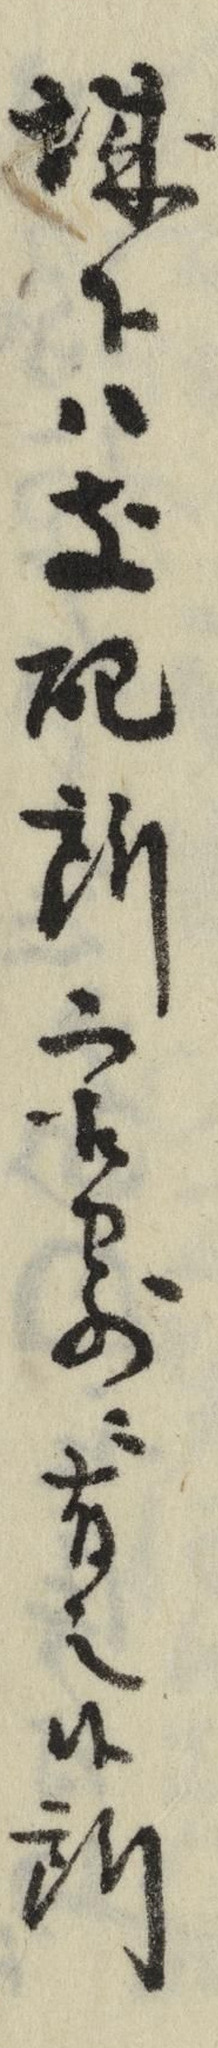城下ハ支配所最寄ニ有之候所
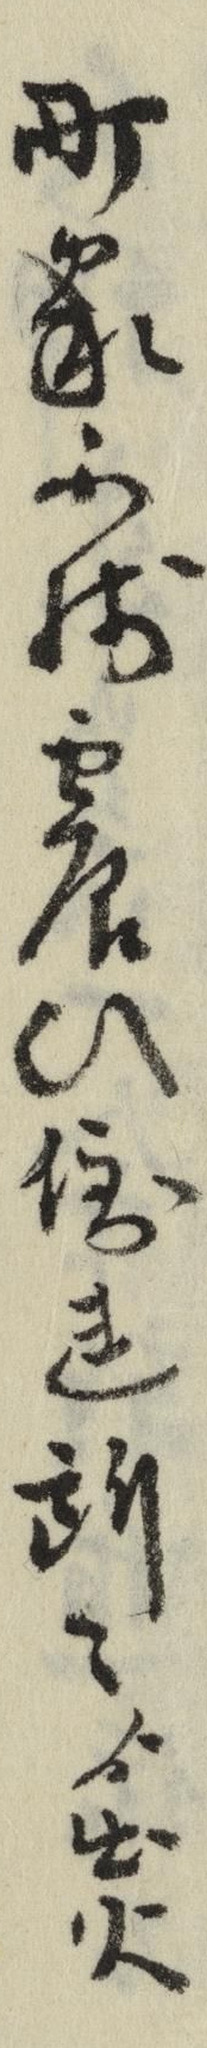町家不残震ひ倒れ所々ゟ出火
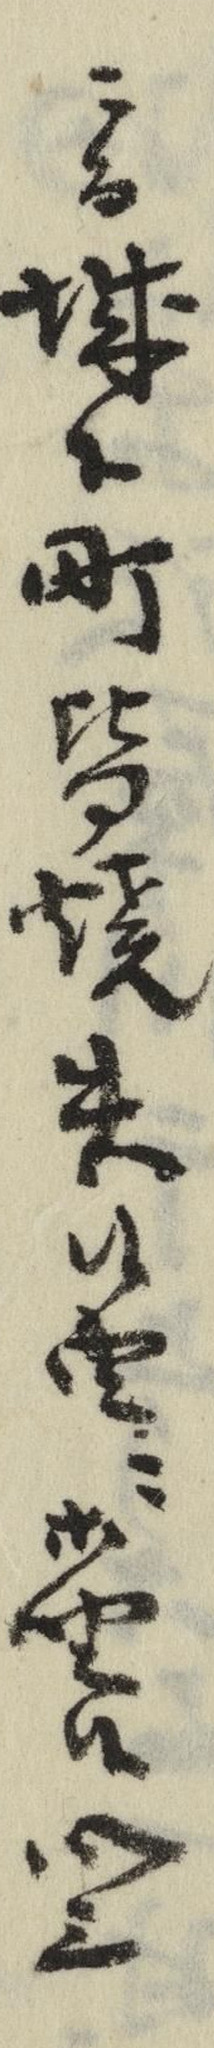ニ而城下町皆焼失候由ニ御座候以上
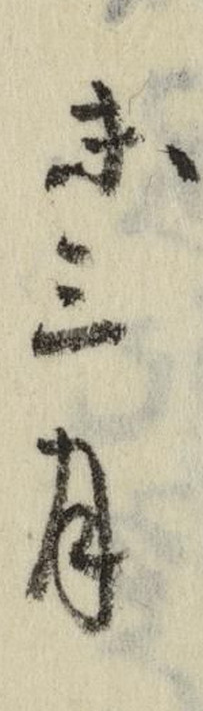未三月
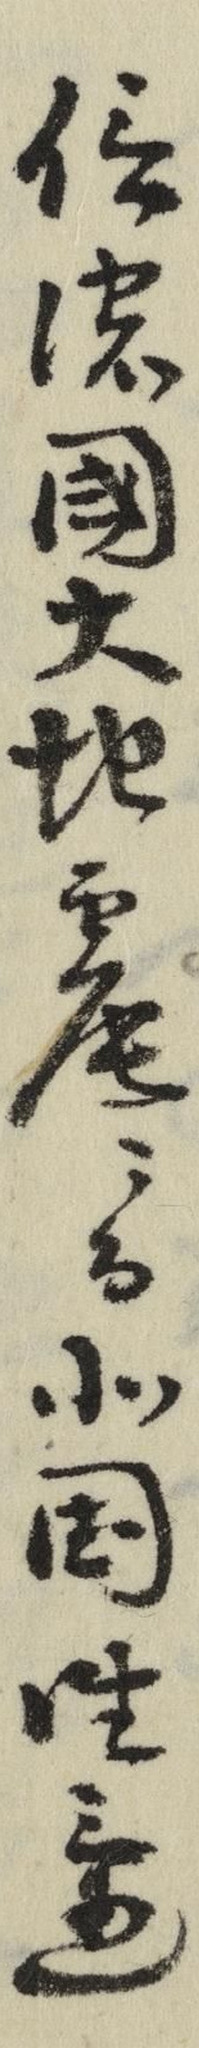信濃国大地震二而北国往還
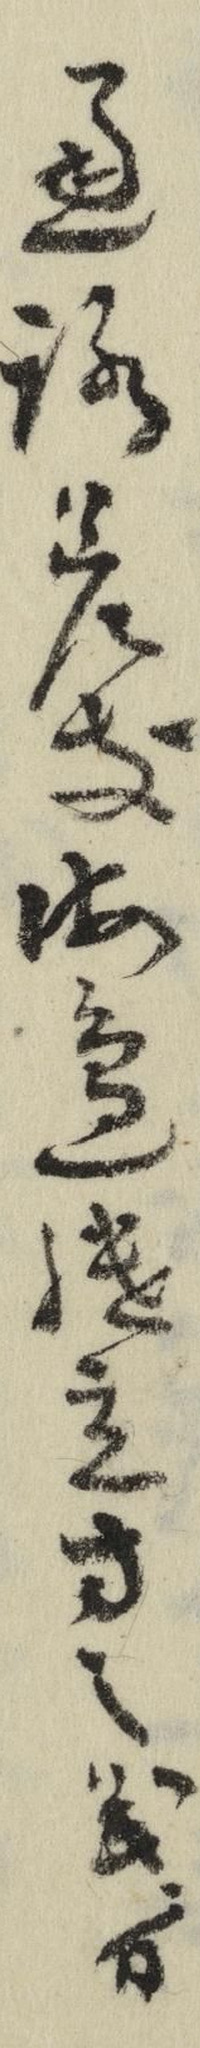通路差支海辺継立方之義二付
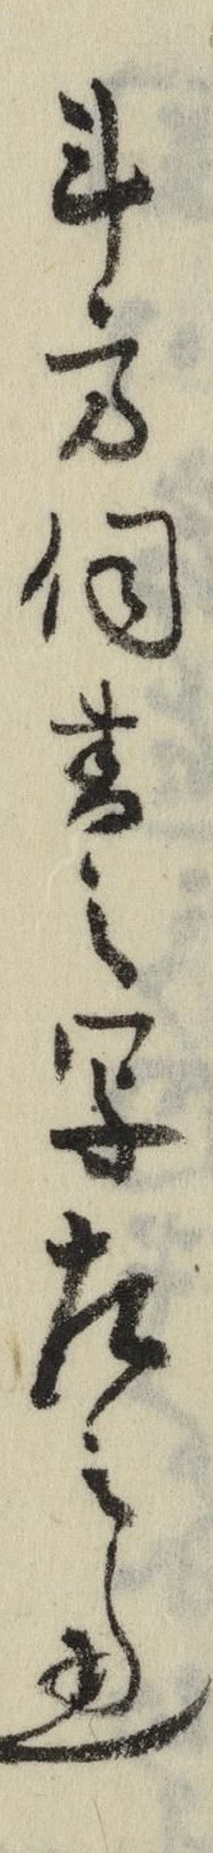斗方伺書之写左之通
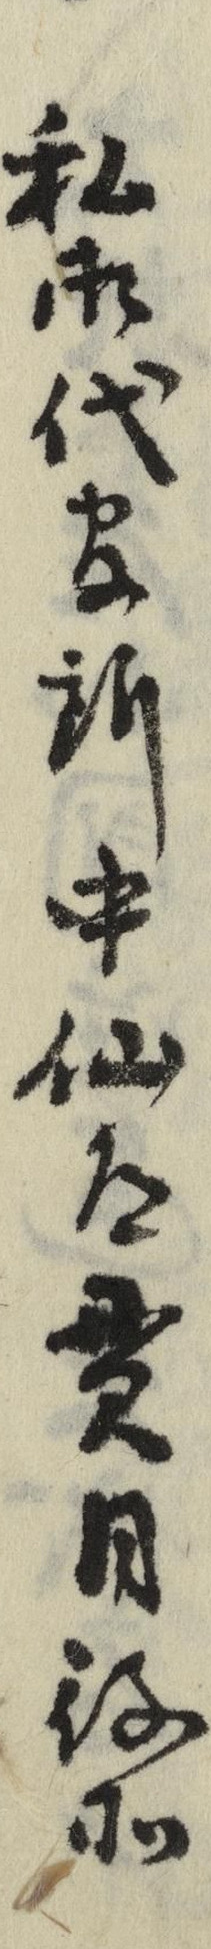私御代官所中仙道貫目役所
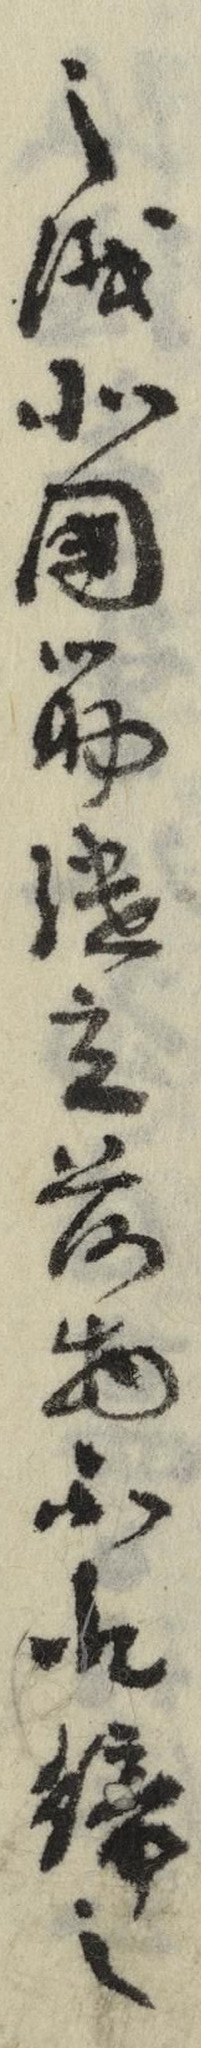之儀北国筋継立荷物等取締之
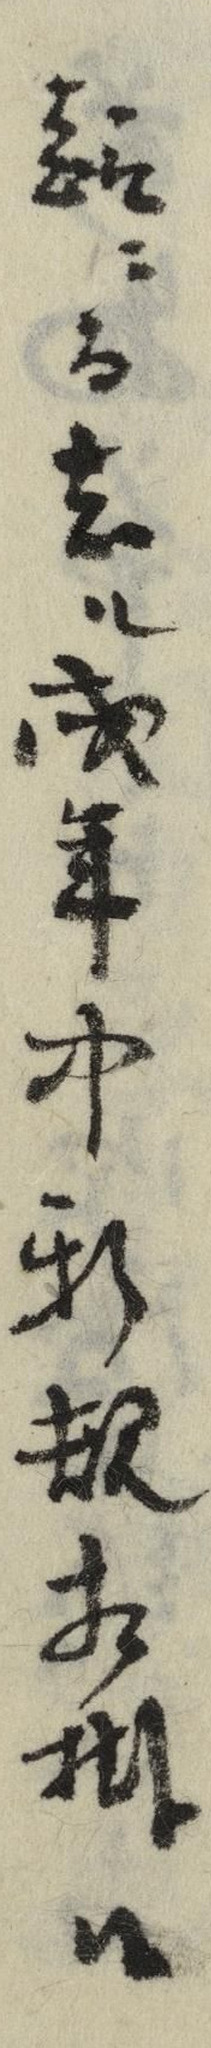諏二而去ㇽ戌年中新規相掛候

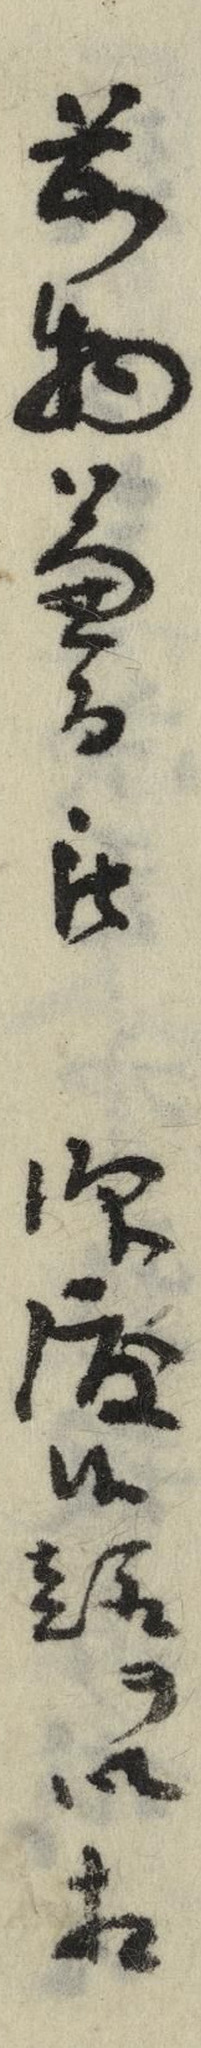荷物兼而被仰渡候諏ヲ以相
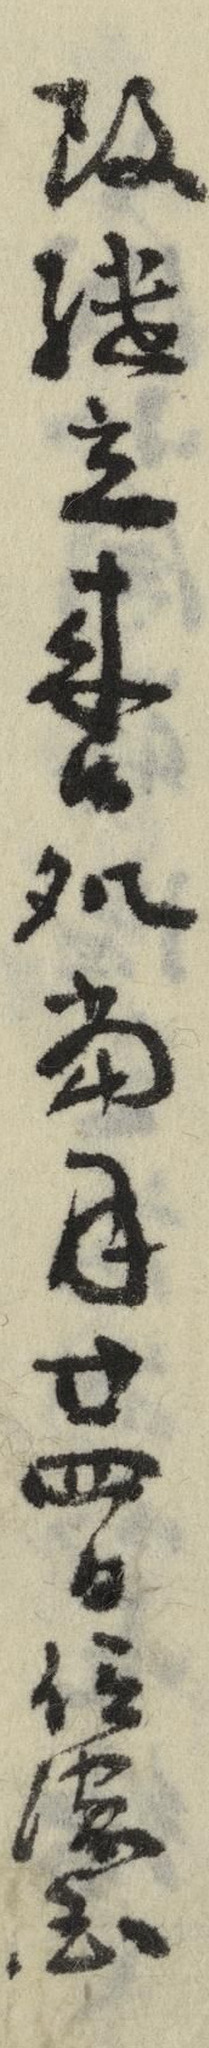改継立来候処当月廿四日信濃国
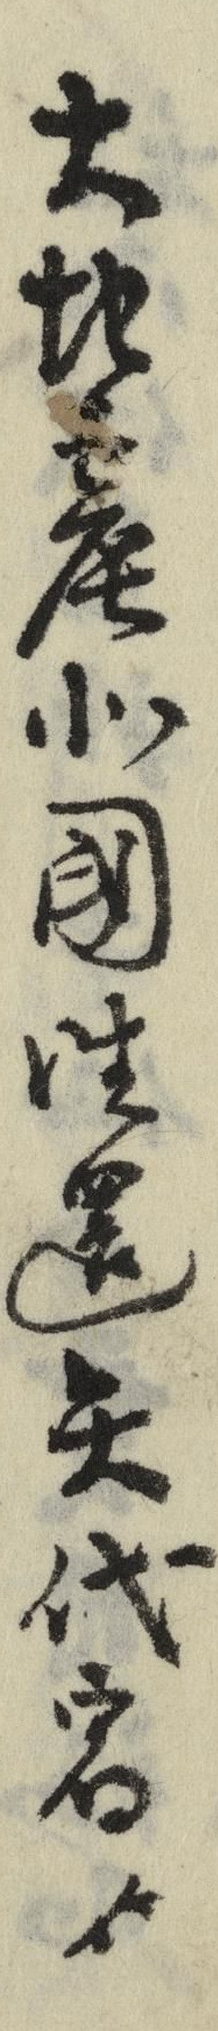大地震北国往還矢代宿ゟ
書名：信州大地震一件之冩　丁未弘化四年三月吉日
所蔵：東京大学地震研究所図書室 Earthquake Research Institute Library, The University of Tokyo, JAPAN
